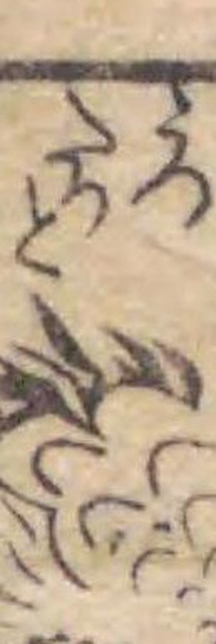たりと
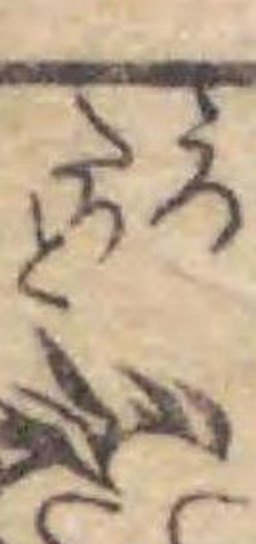たりと
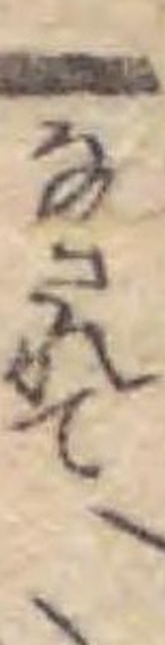なされて
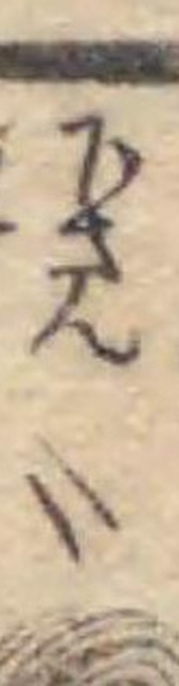下さん
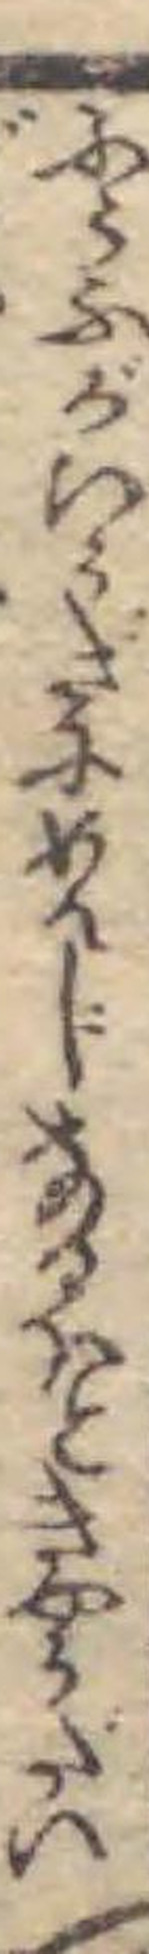ふうふがちうぎにめんじなるほときやうだい
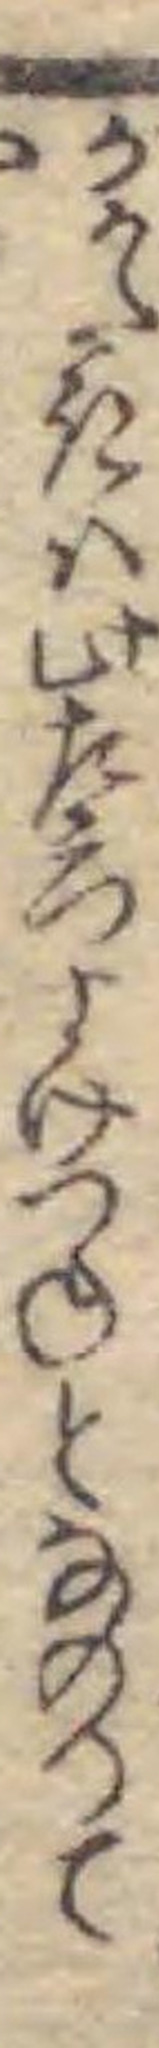がかたきは此左衛門すけつねとなのりて
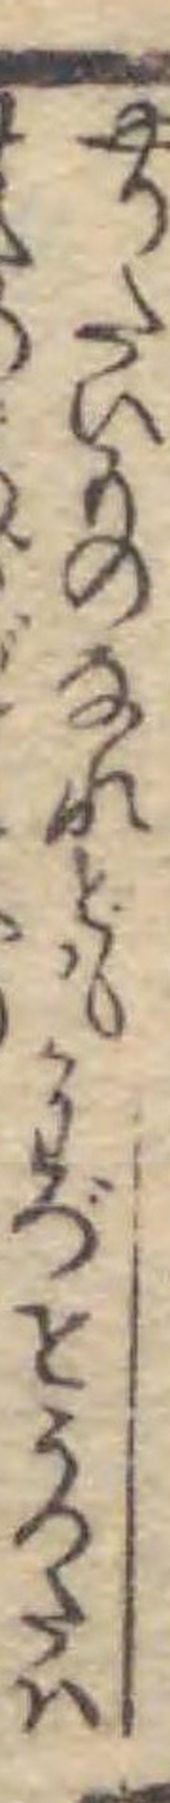やりたいものなれどもかはづをうつたは
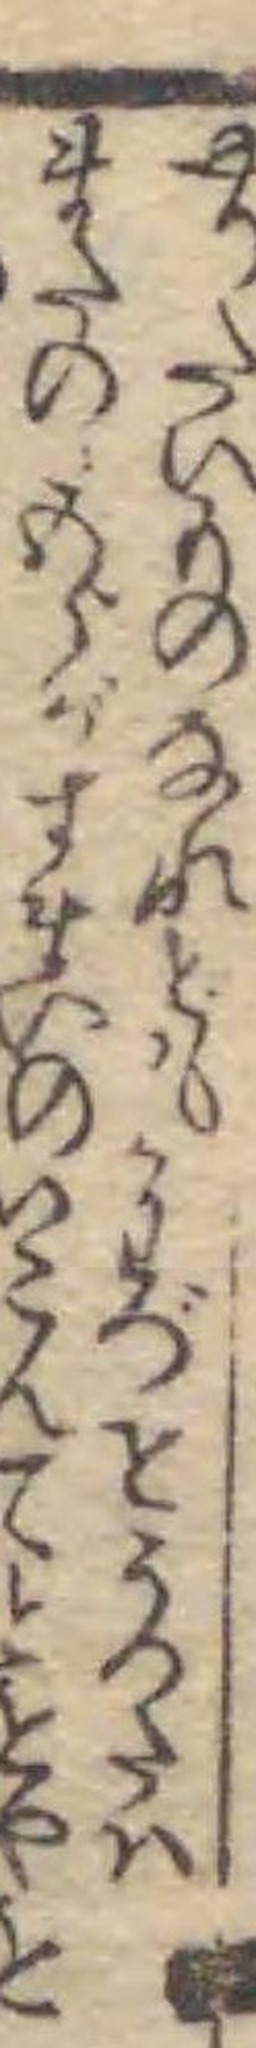またの五郎がすまいのいこんてとをやを
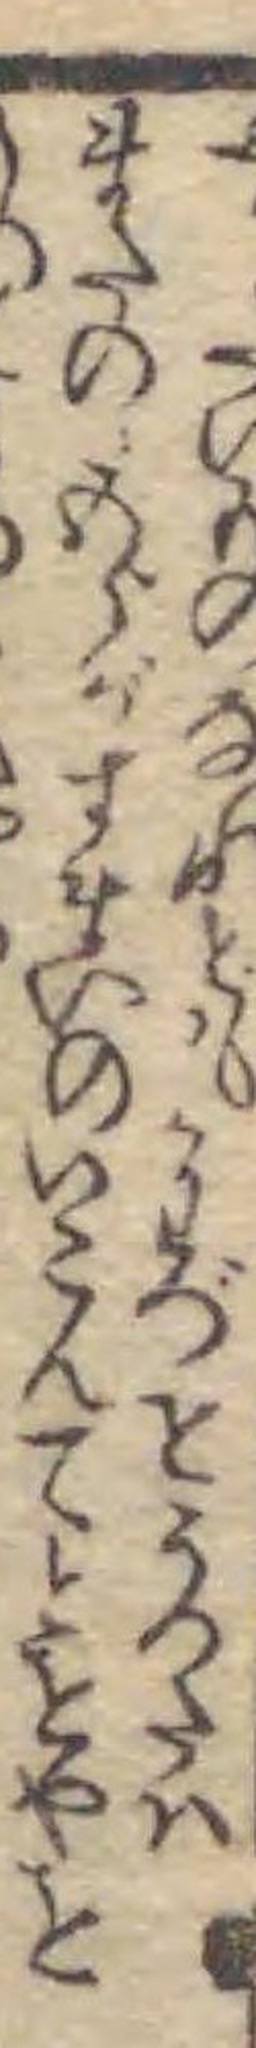またの五郎がすまいのいこんてとをやを
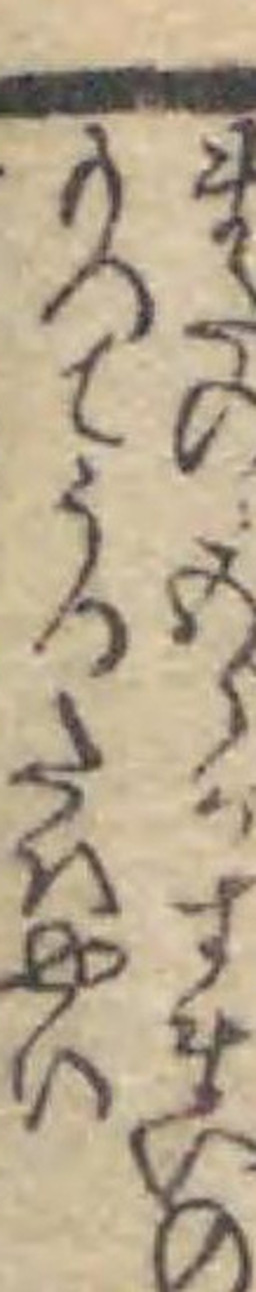もつてうつたはやい
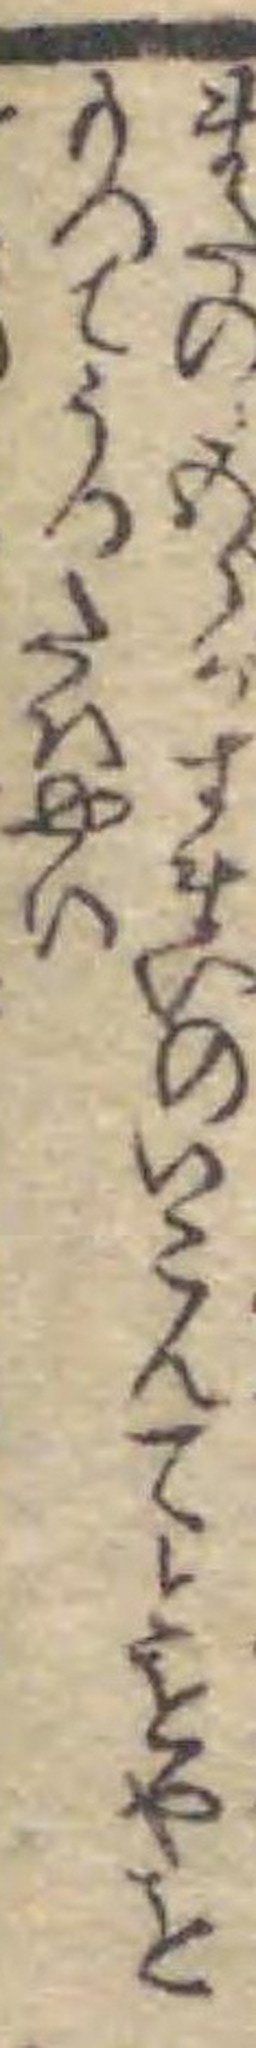もつてうつたはやい
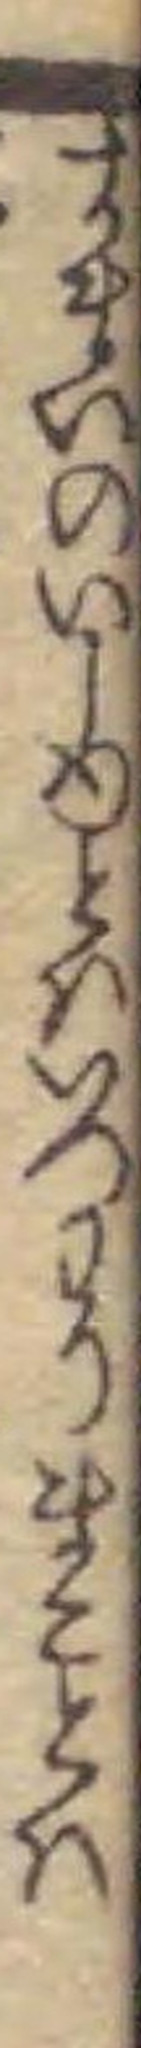すまいのいしゆとはいつわりまことは
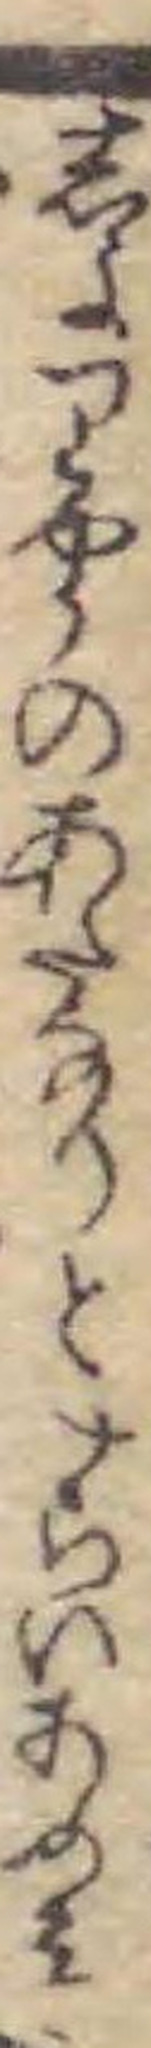しよりやうのあたなりとけらいあふみ
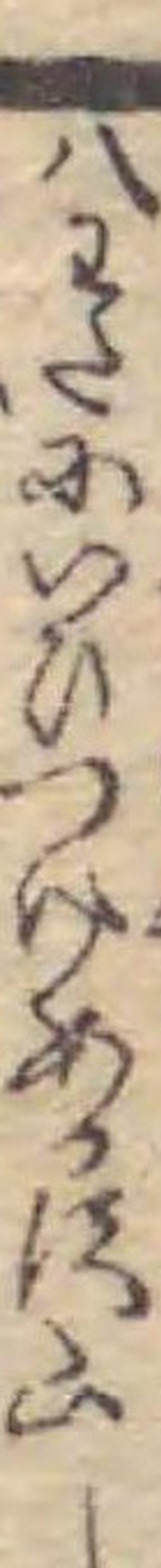八わたにいひつけあか沢山
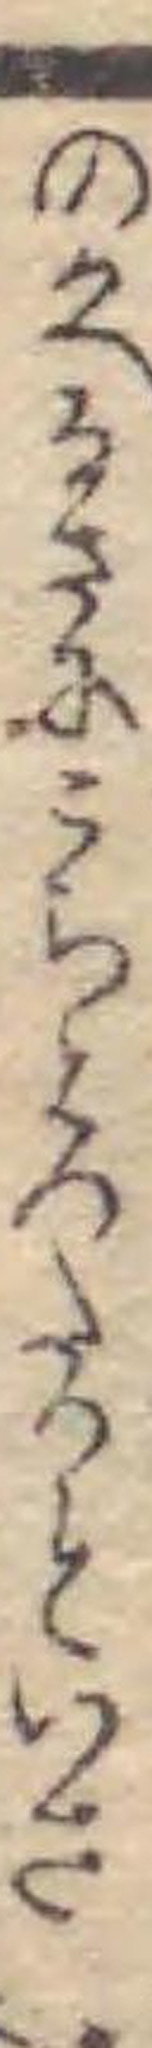のかへるさにうちとつたりといさ
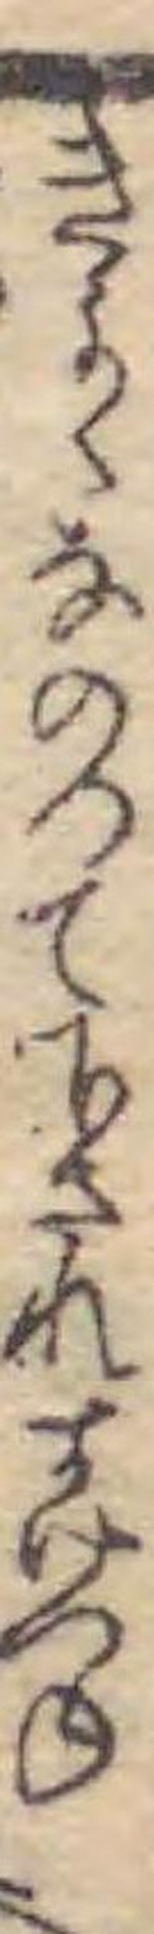きよくなのつて下されすけつね
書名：扨化狐通人 : 2巻
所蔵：国立国会図書館 National Diet Library, JAPAN
